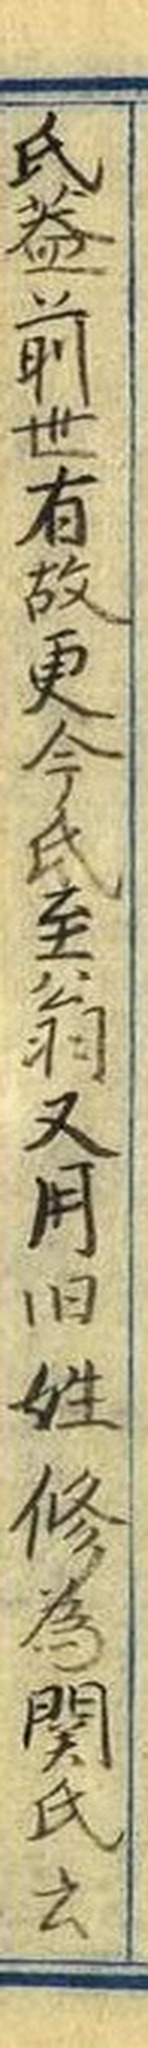氏蓋前世有故更今氏至翁又用旧姓修為関氏云
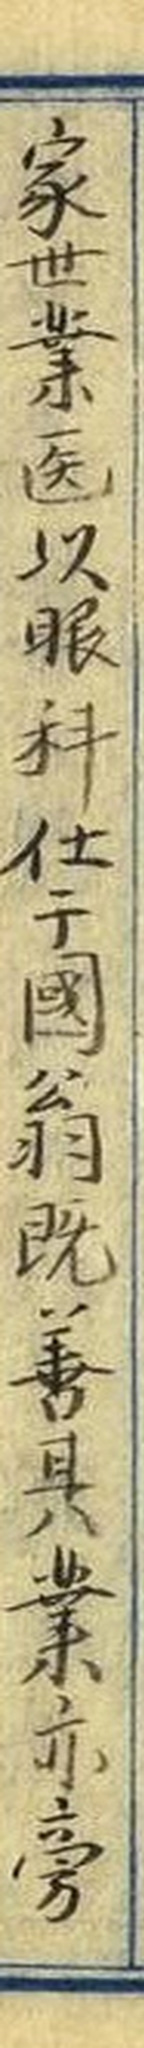家世業医以眼科仕于國翁既善其業亦旁
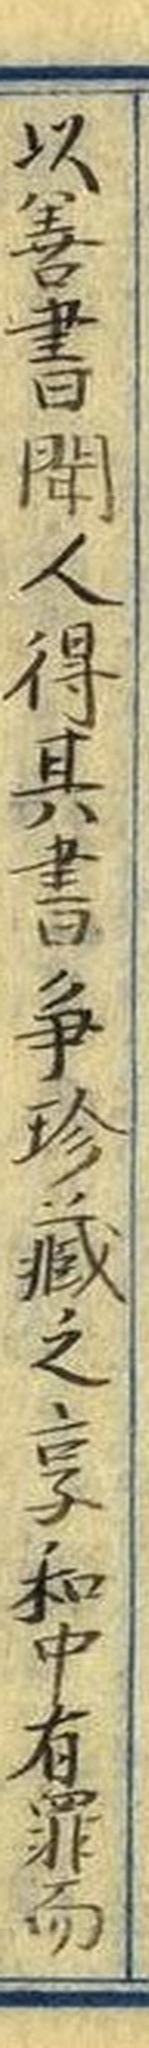以善書聞人得其書争珍藏之享和中有罪而
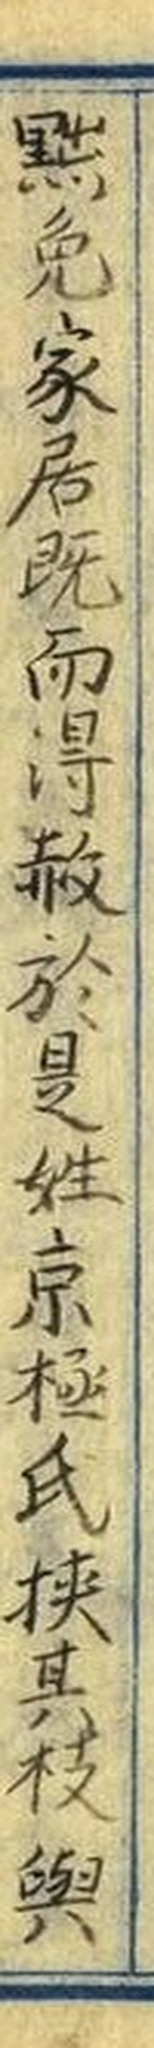點免家居既而得赦於是姓京極氏挟其枝與
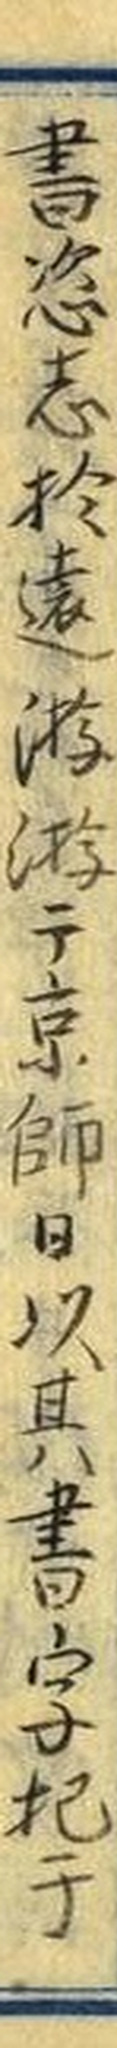書恣志於遠游游于京師日以其書字圮于

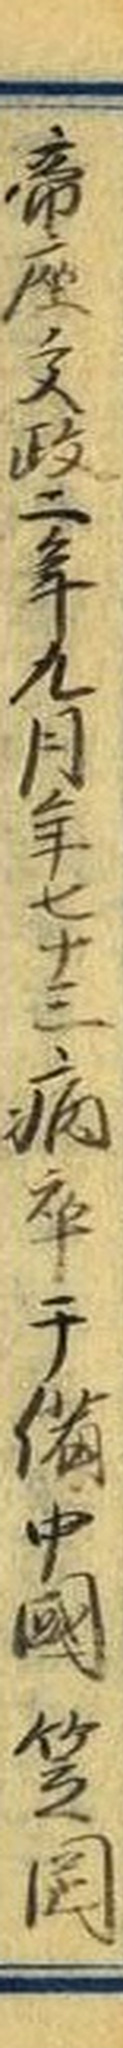帝座文政二年九月年七十三病卒于備中國笠岡
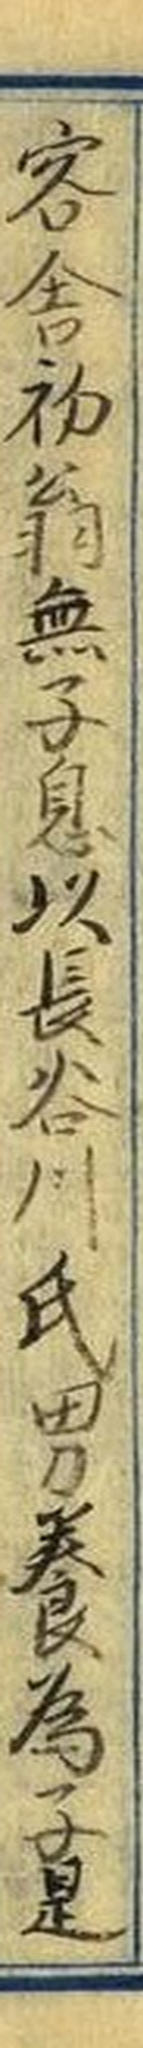客舎初翁無子息以長谷川氏男養為子是
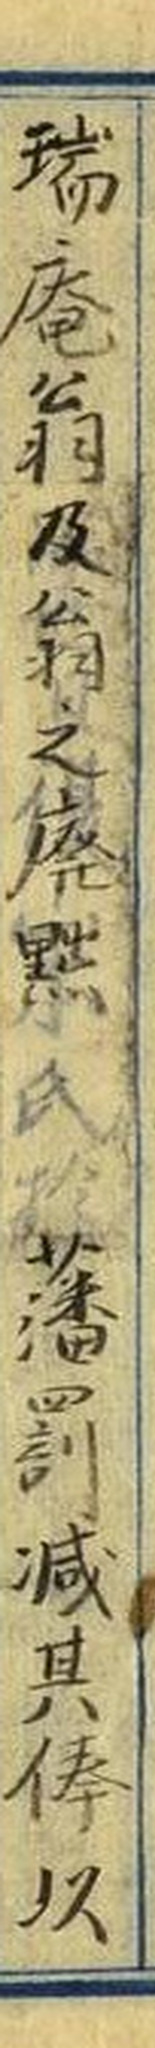瑞庵翁及翁之廃點藩罰減其俸以
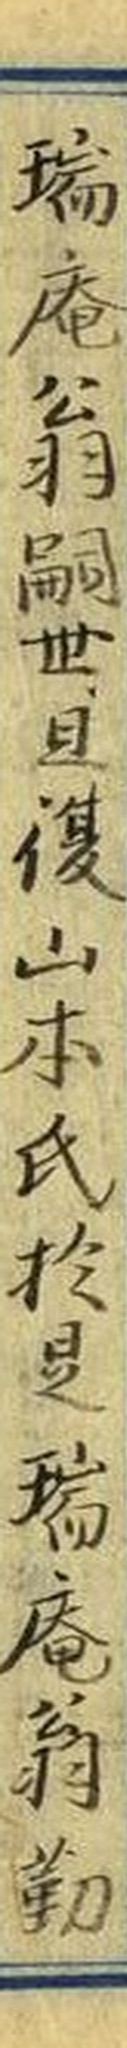瑞庵翁嗣世且復山本氏於是瑞庵翁勤
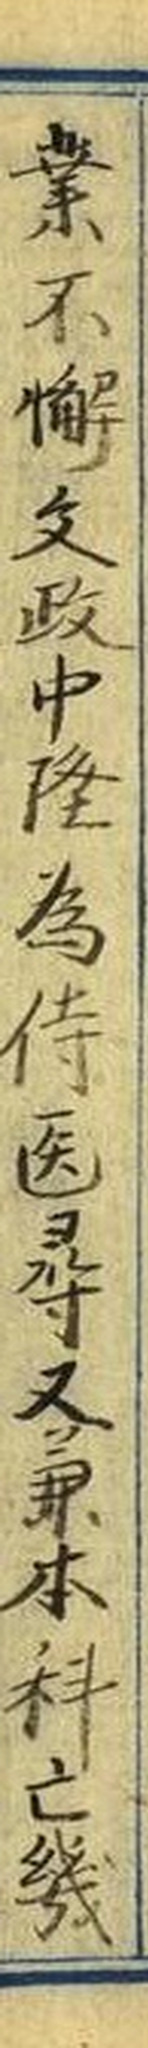業不懈文政中隆為侍医尋又兼本科亡幾
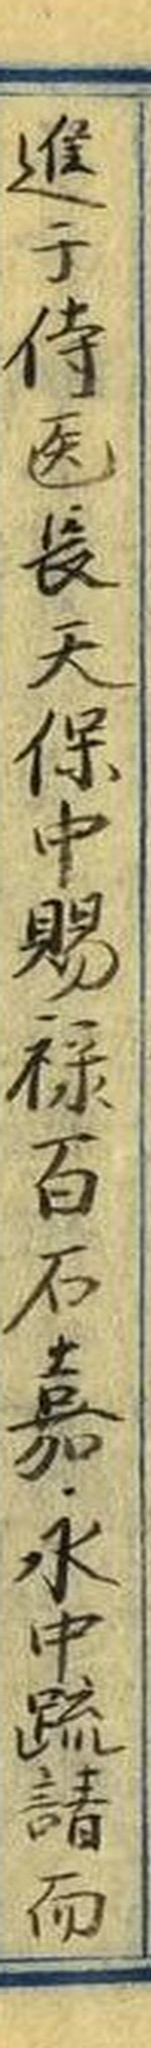進于侍医長天保中賜禄百石嘉永中䟽請而
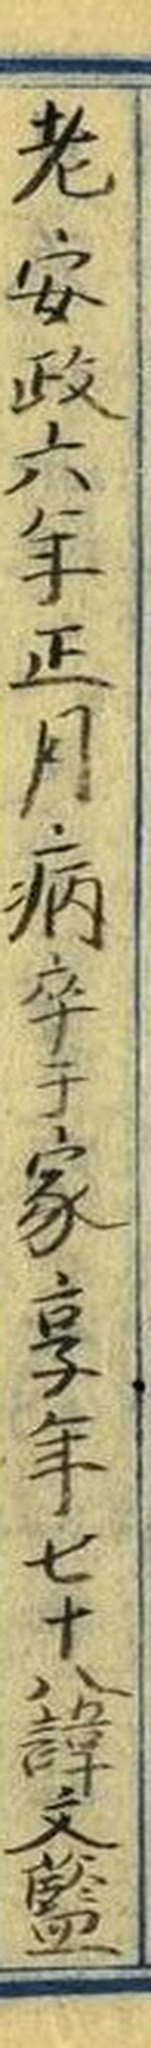老安政六年正月病卒于家享年七十八諱文藍
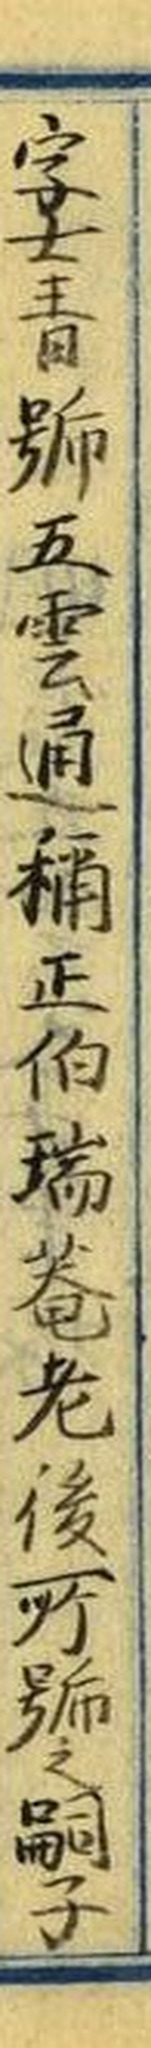字士青號五雲通稱正伯瑞菴老後所號之嗣子
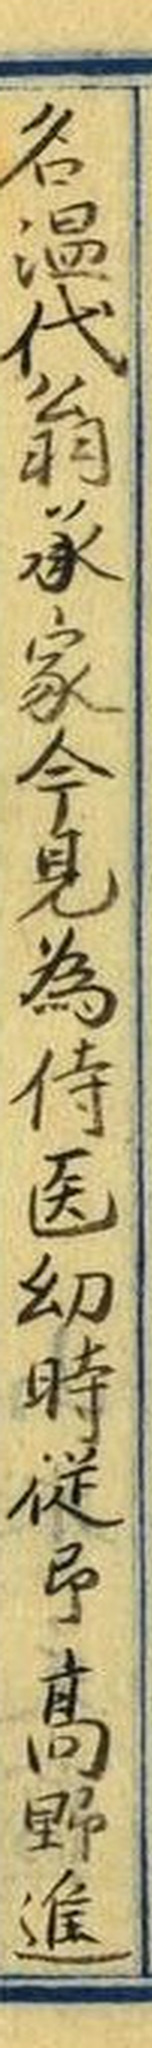名温代翁承家今見為侍医幼時従郎高野進
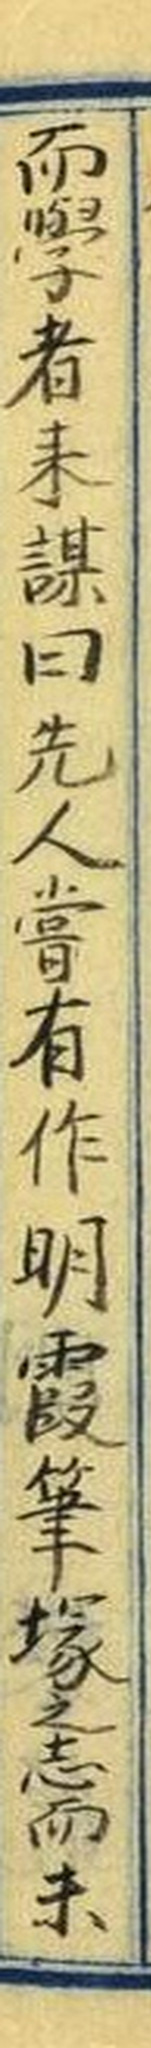而學者来謀曰先人嘗有作明霞筆塚之志而未
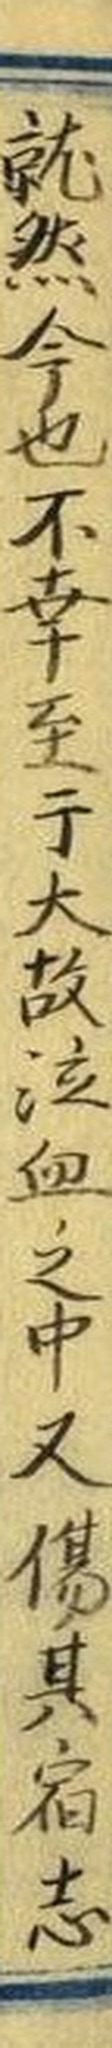就然今也不幸至于大故泣血之中又傷其宿志
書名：温古集 四巻
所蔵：福井県文書館 Fukui Prefectural Archives
